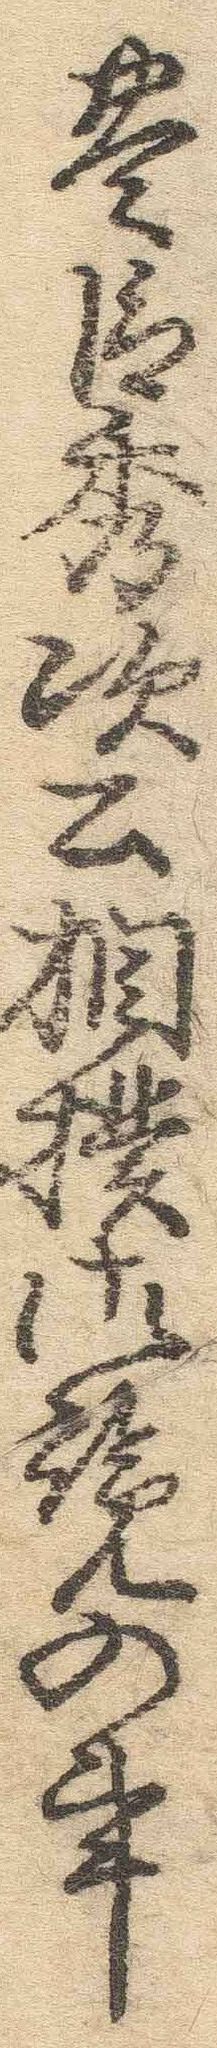豊臣秀次公相撲御覧の事
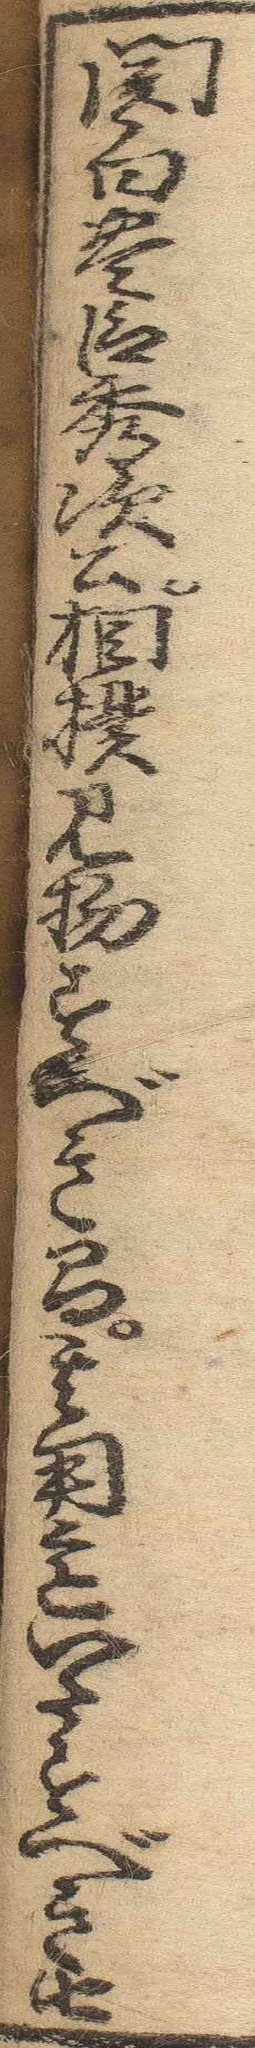関白豊臣秀次公。相撲見物すべき間。其用意いたすべき由
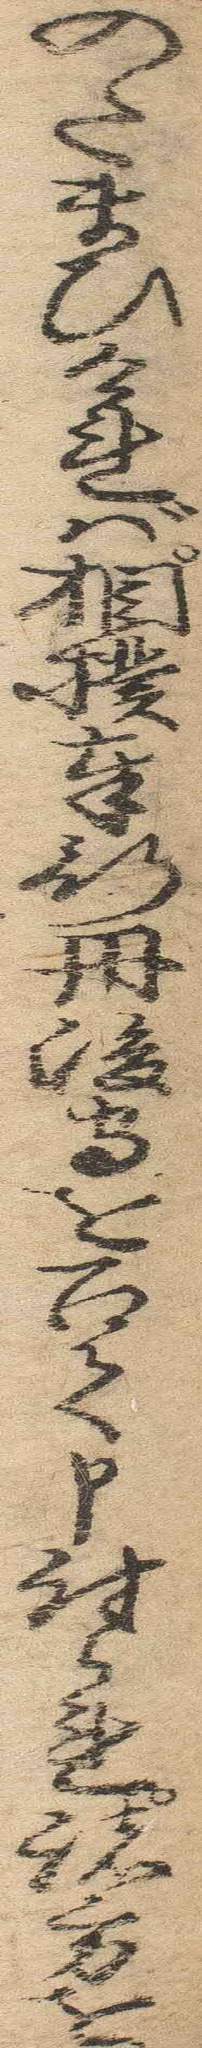のたまひければ相撲奉行丹後守を召て申付諸方を
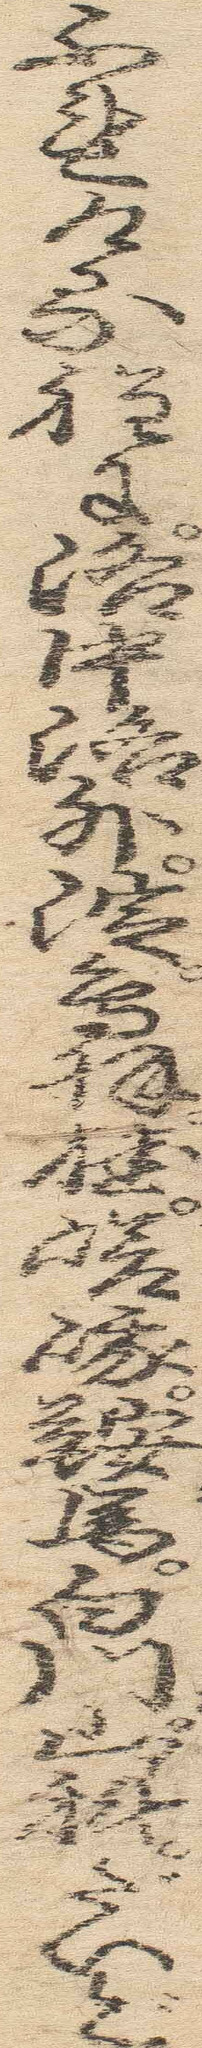ふれける程に。洛中洛外。淀。鳥羽。桂。嵯峨。鞍馬。白川。山科。ざい々
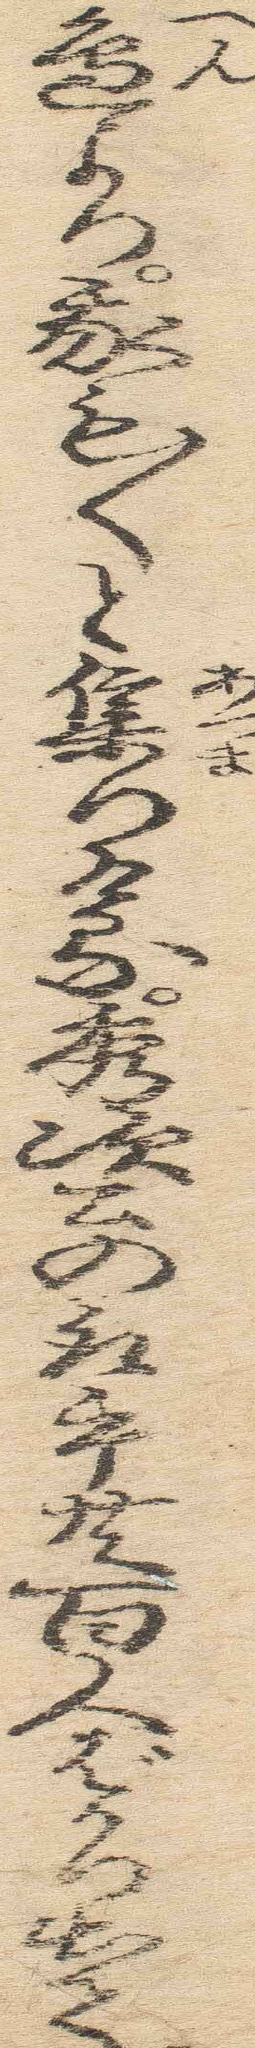辺より。我も〳〵と集りける。秀次公の取手共百人ばかり出て。
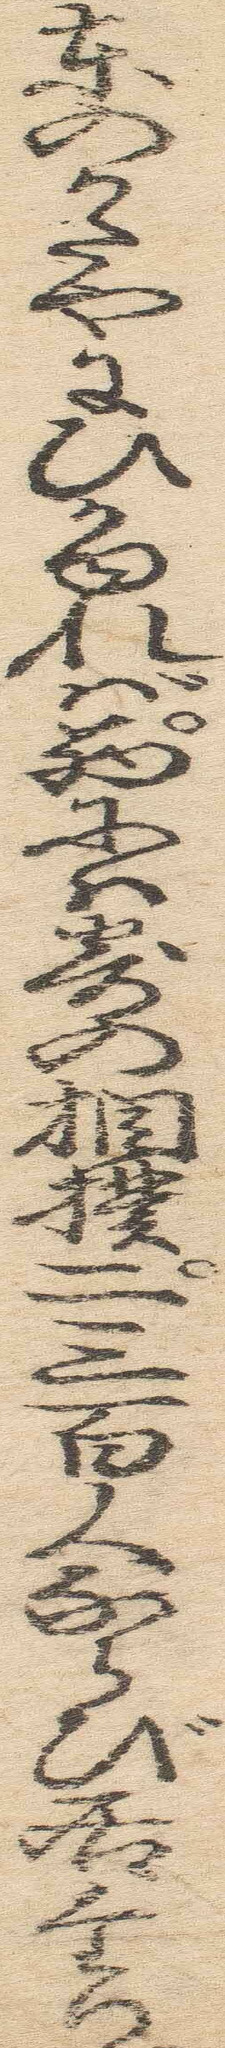東のかたやにひかゆれば。西には寄の相撲二三百人ならび居けり
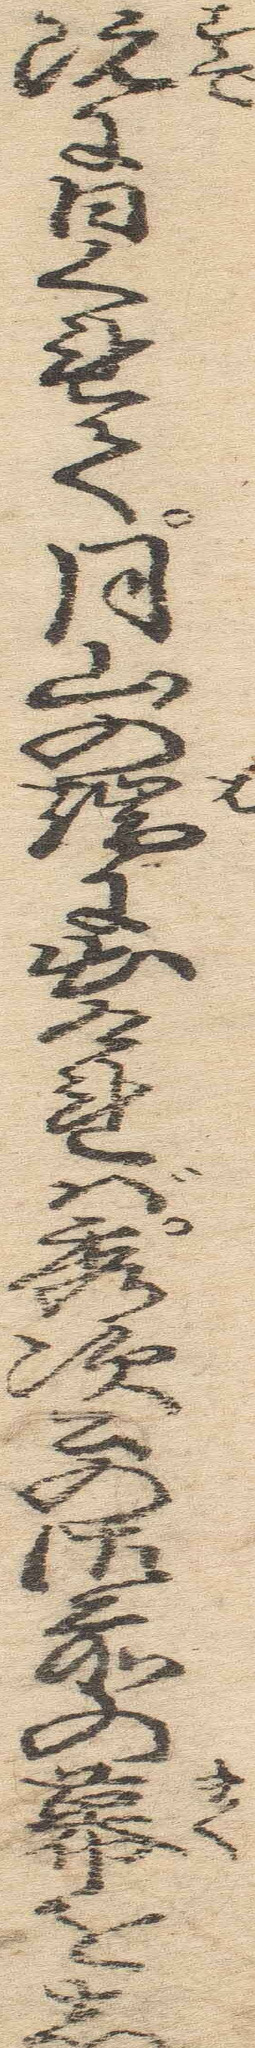既に日くれて。月山の端に出ければ。秀次公の御前の幕をし
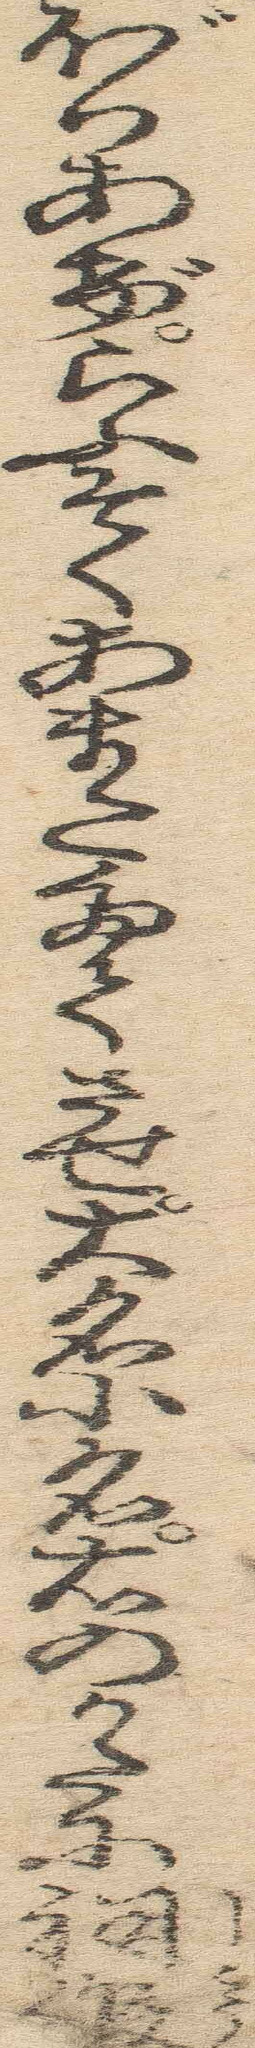ぼりあげ。らうそくあまたたてさせ大名小名。右のかたに祠候
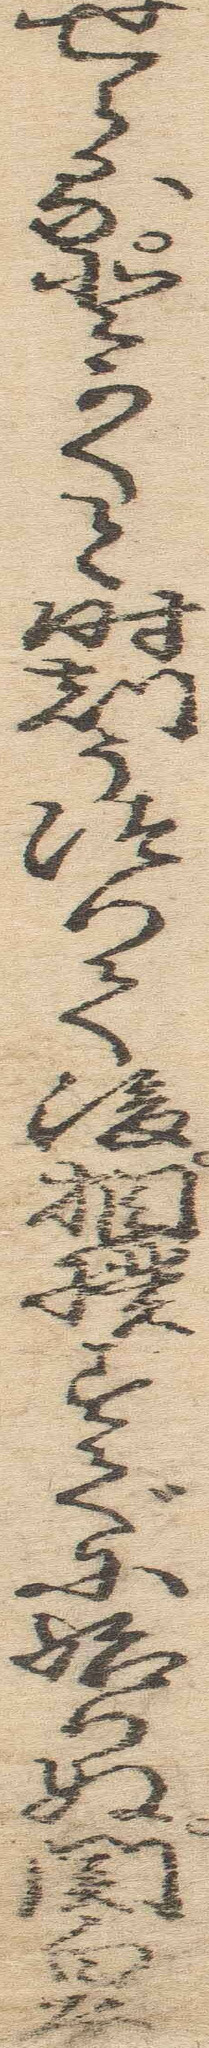せらる。とかくと時刻うつりて後。相撲すでに始りぬ。関白殿
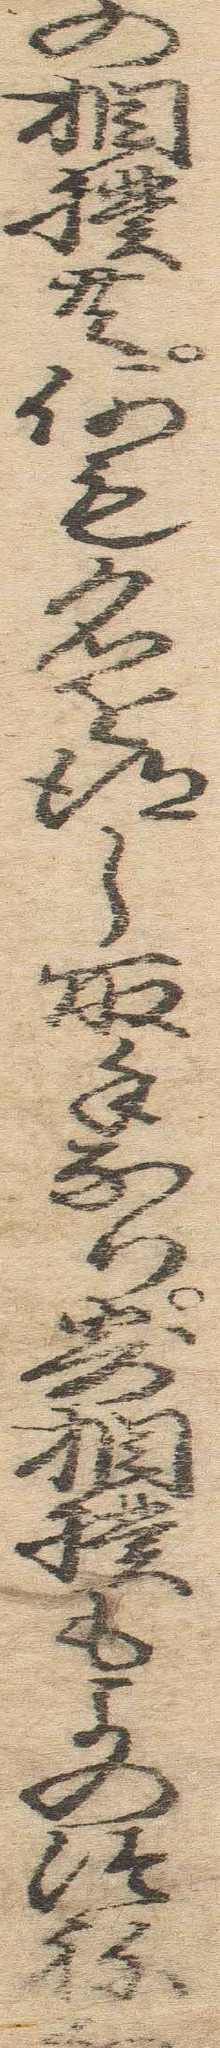の相撲共。何も名を得し取手なり。寄相撲もよのつねなら
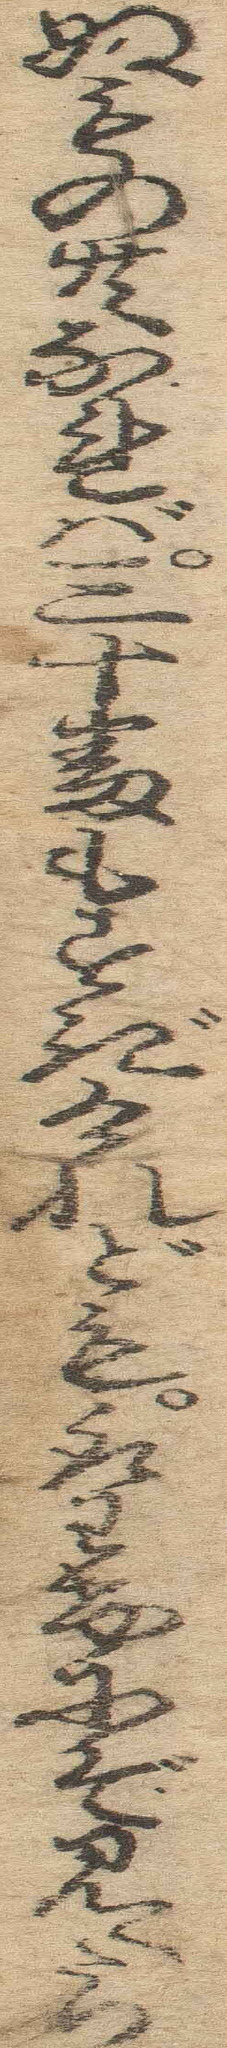ぬもの共なれば。三十番もすぎけれども。取わけにぞみへたり

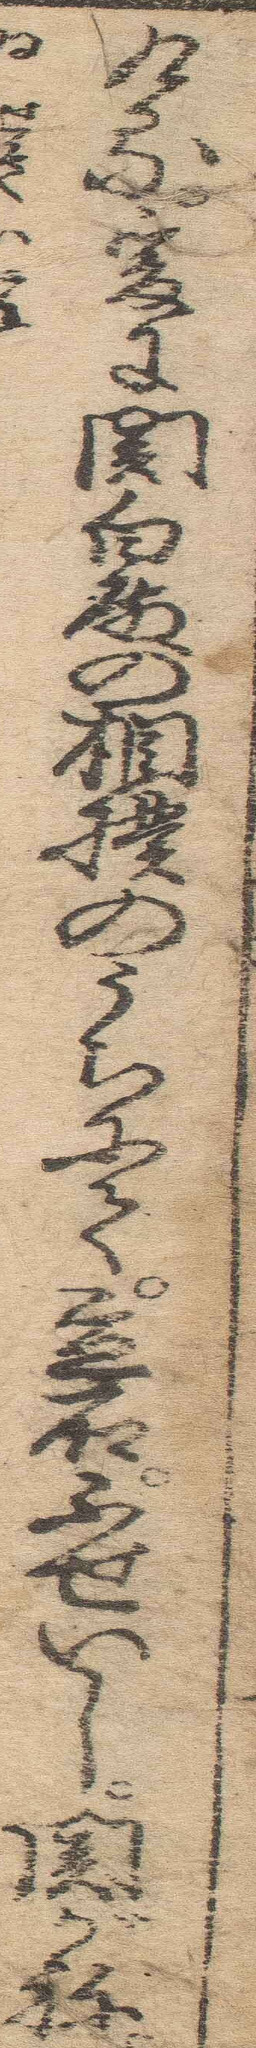ける。実に関白殿の相撲のうちにて。昼夜。ふせいし。関がね。
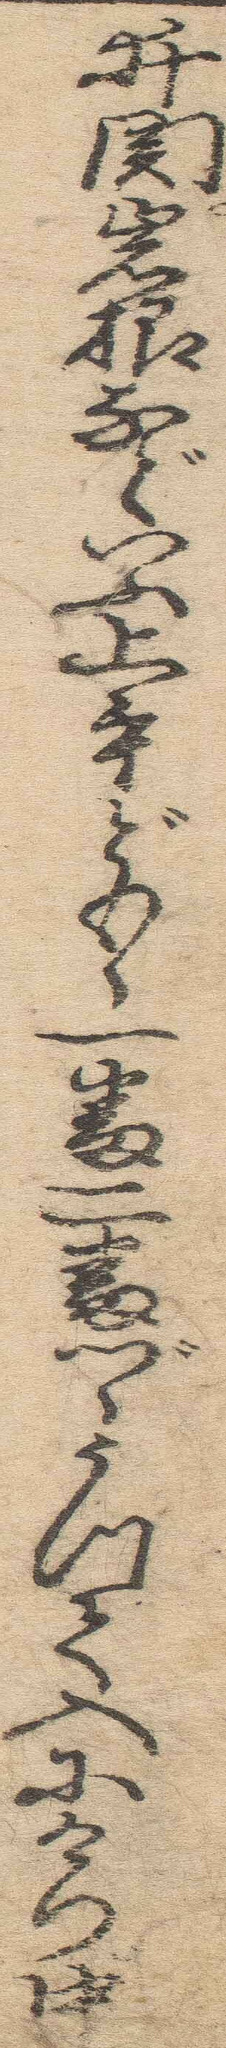井関。岩根などいふ上手どもゞ一番二番づゞとつて入にけり。中
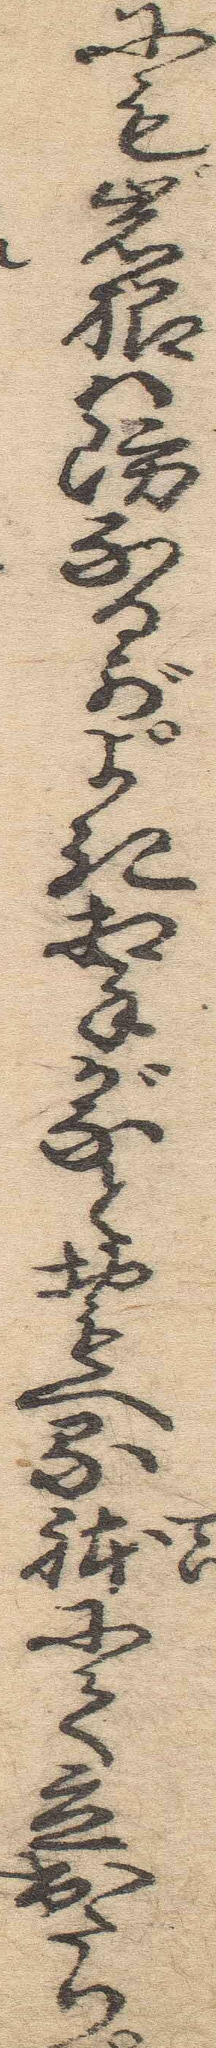にも。岩根は防なるが。よき相手がなとおもへる体にて立出たり。
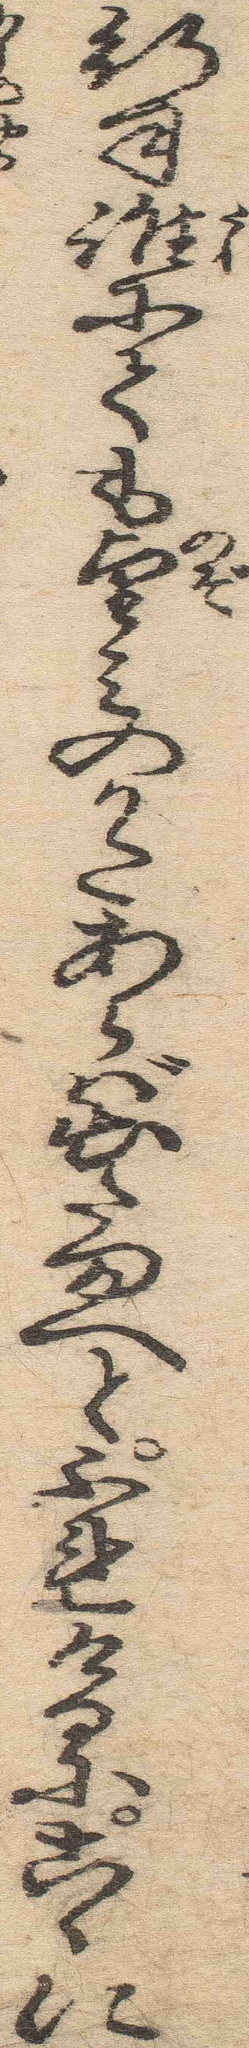行司誰にても望みのかたあらば出たまへと。ふれけるに。こゝに
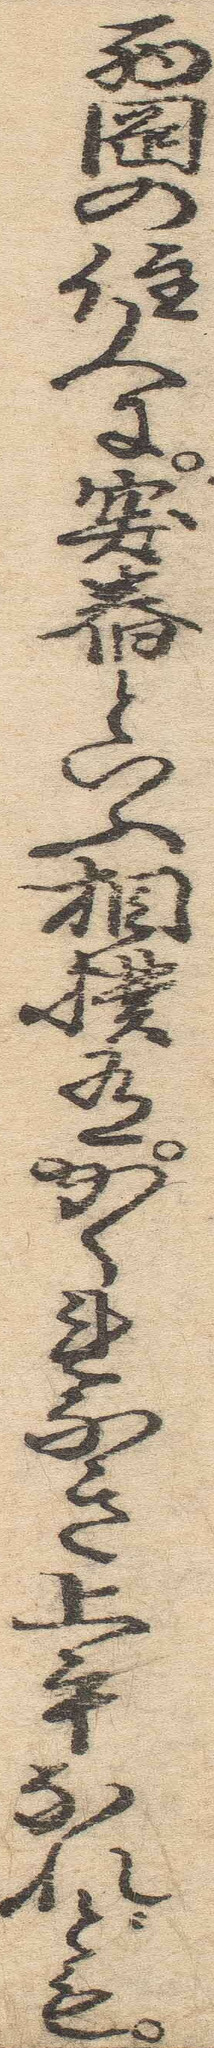西岡の住人に突舂といふ相撲有。かくれなき上手なれども。
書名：古今相撲大全
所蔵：東京学芸大学附属図書館 国文学研究資料館
